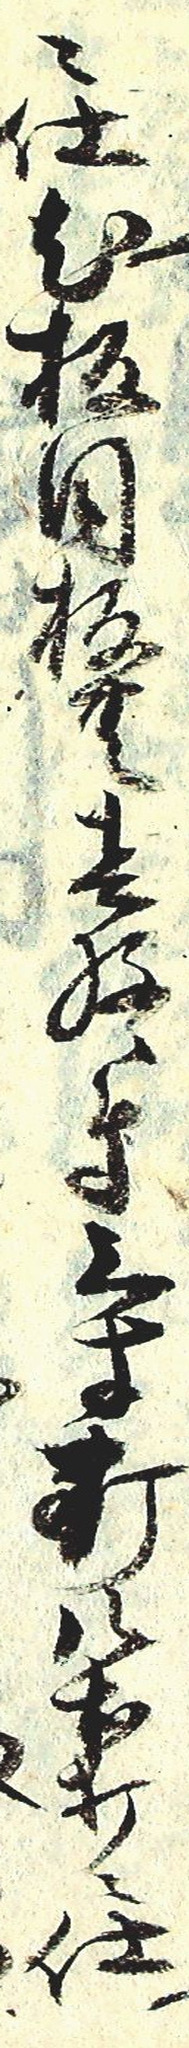に仕尤板目板共壱枚に付三寸釘八本打に仕
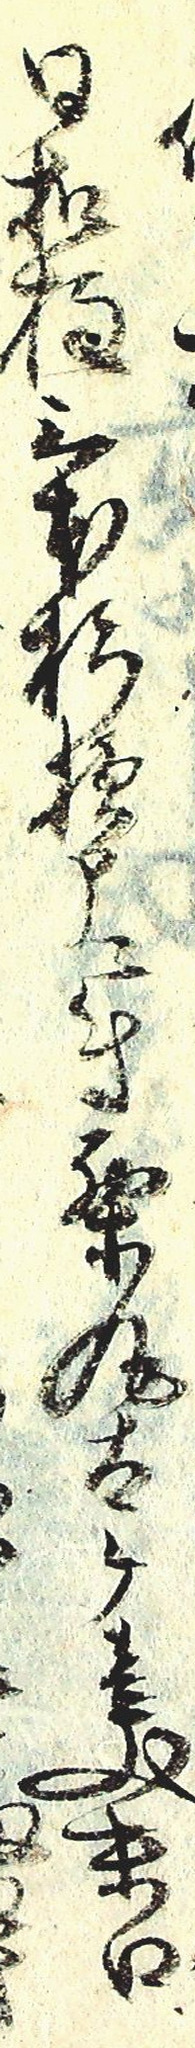同扣柱三本折損申に付栗丸太を壱丈末口
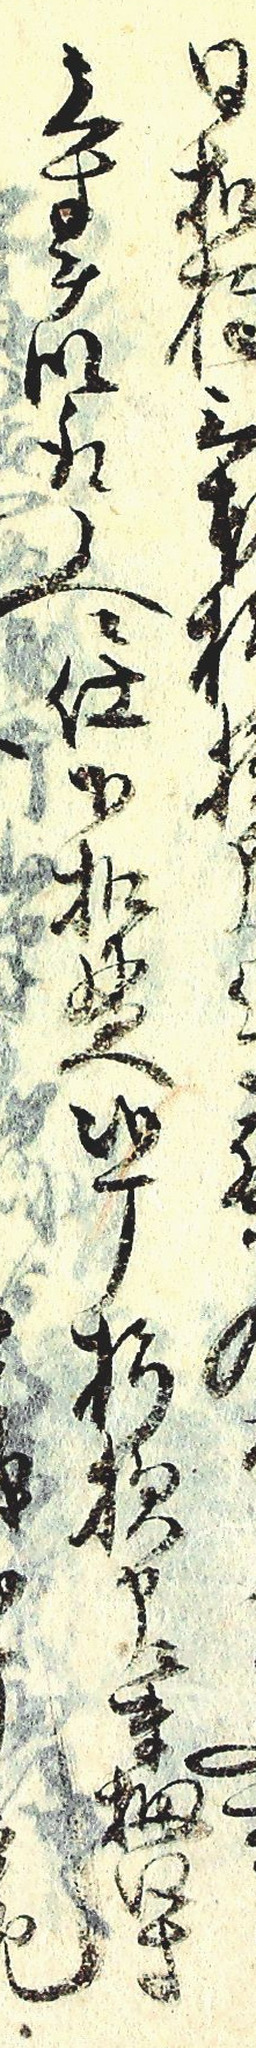三寸を以取かへに仕下扣貫弐丁折損申に付栂四寸
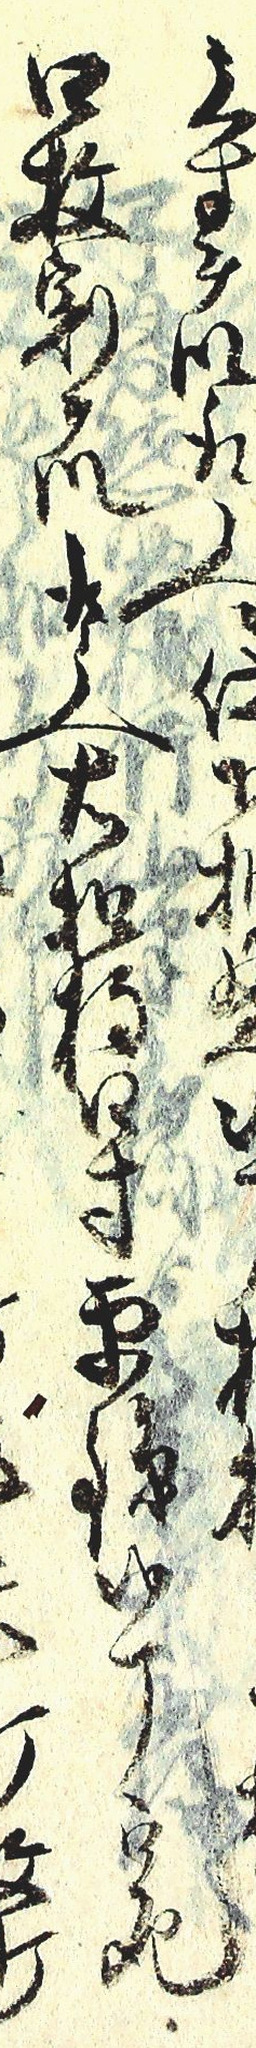四枚割を以取かへ右扣柱四寸平銯弍丁宛
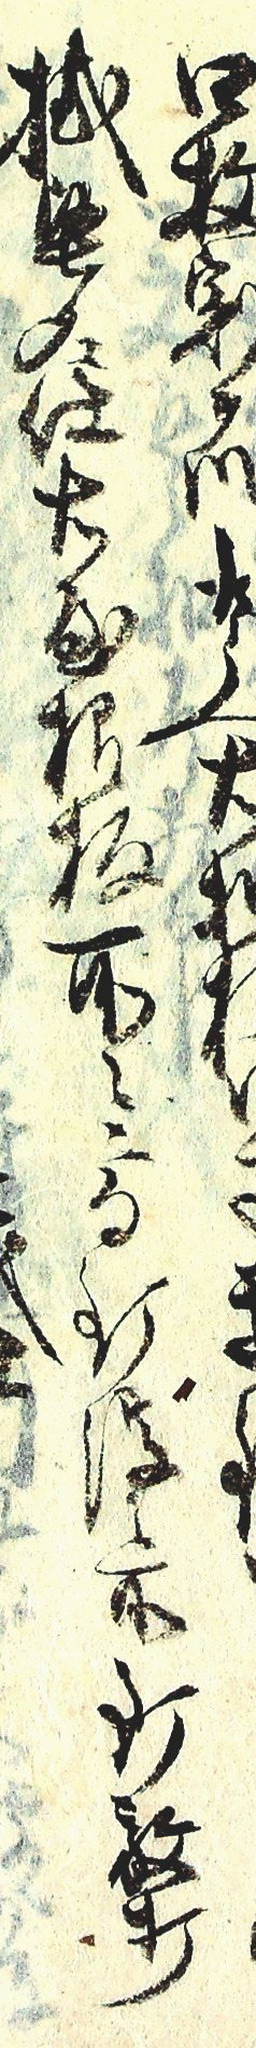掛堅めに仕右屋根板所々にて釘浮之所釘放打
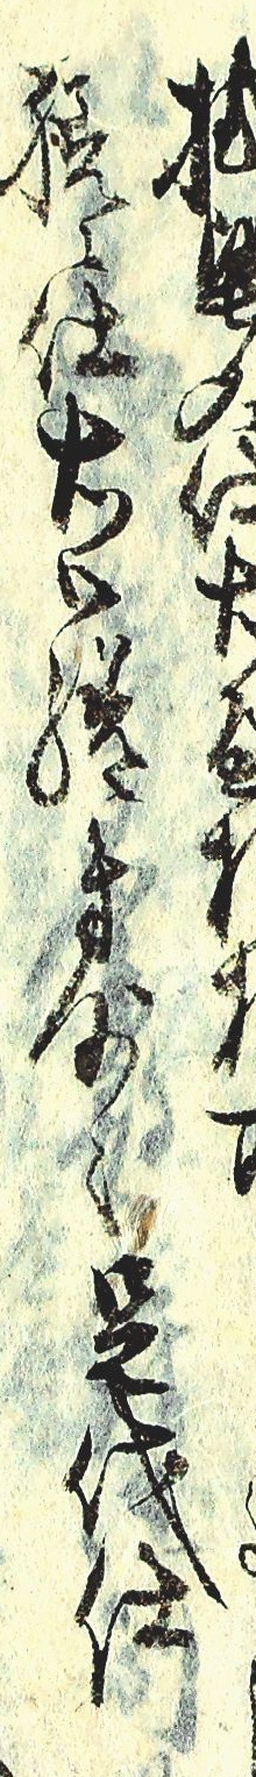繕に仕右御繕に付何々足代仕
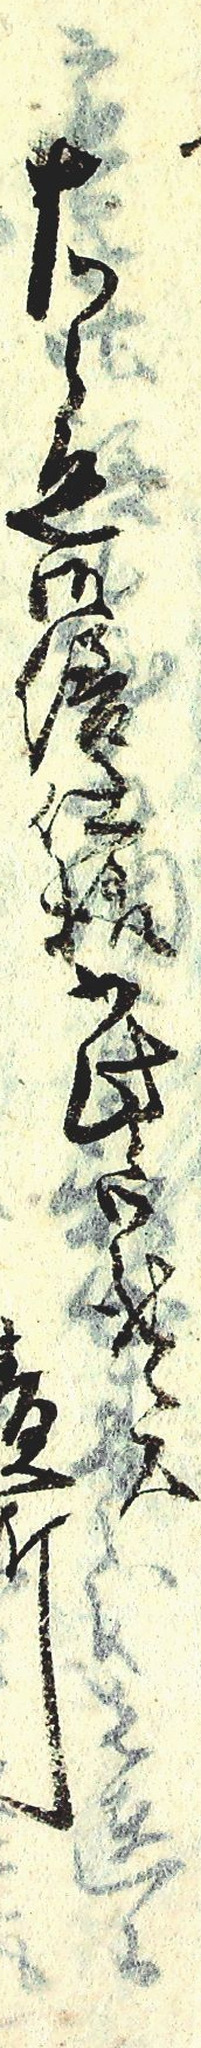右之通御繕仕様如此御座候以上
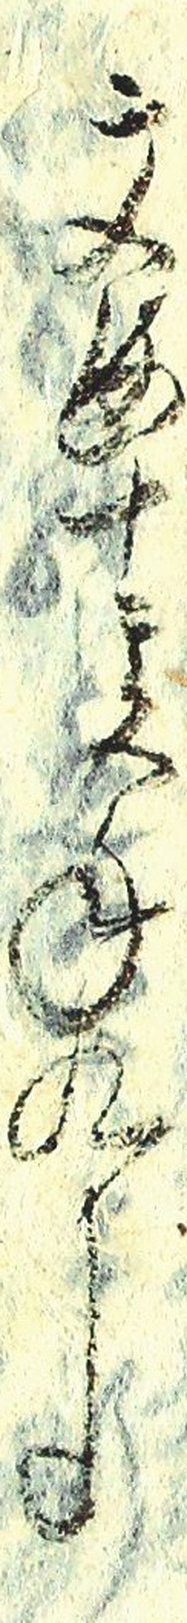文政十亥年九月
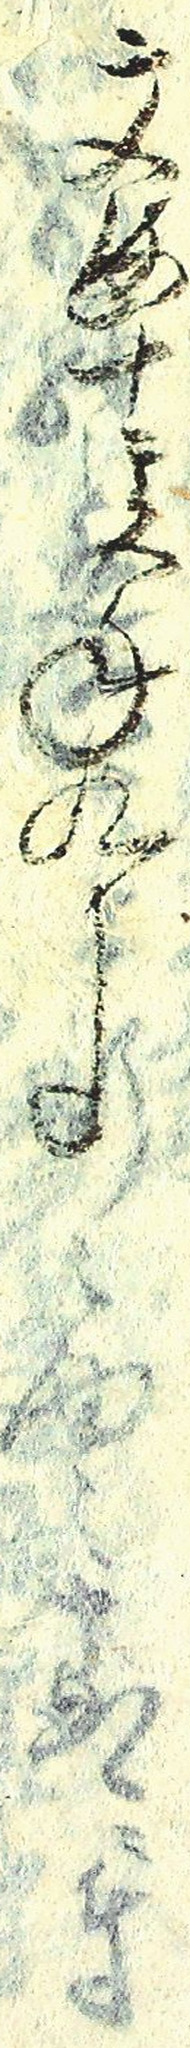文政十亥年九月
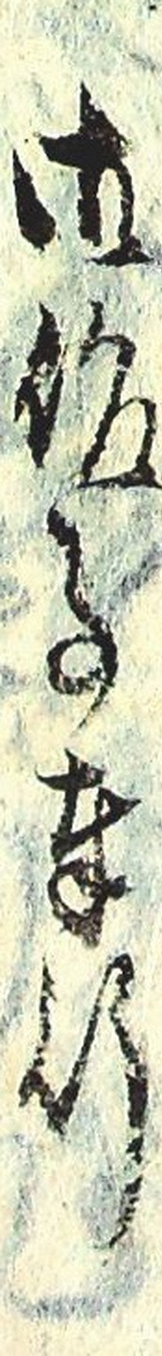御作事奉行
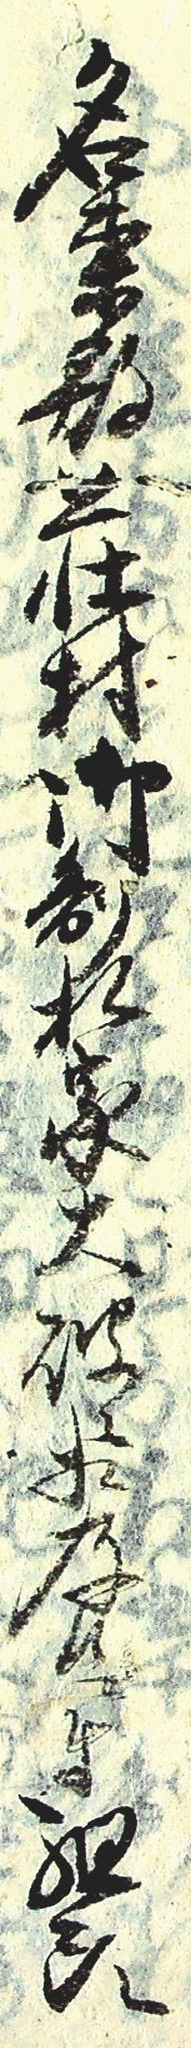名東郡庄村御制札家大破に相及候に付組頭
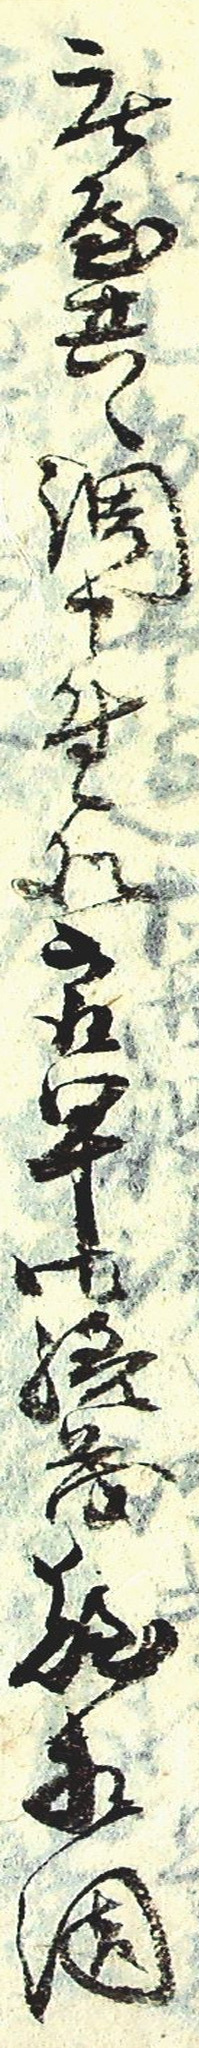庄屋共へ調申付候処最早御繕も難相調
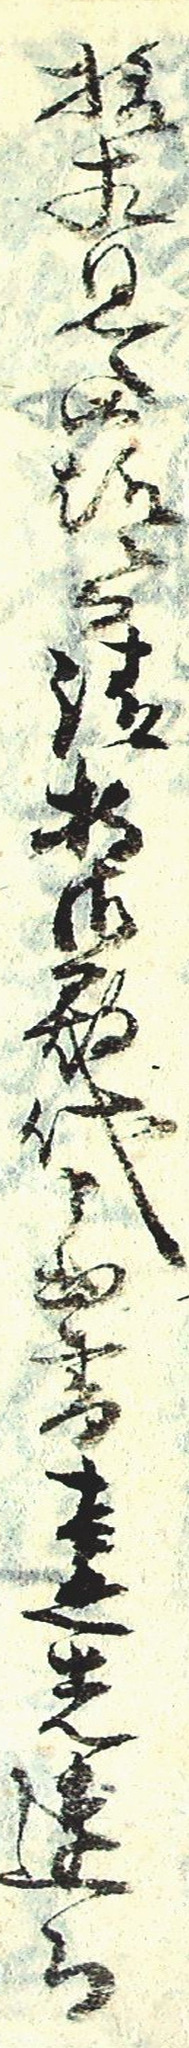様相見候御趣にて請持御郡代申出書壱通先達て
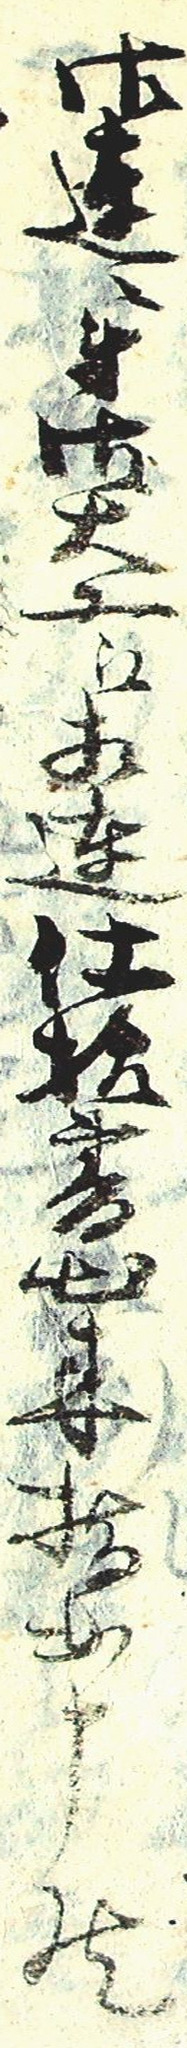御達に付御大工え相達仕様書出来指出申候
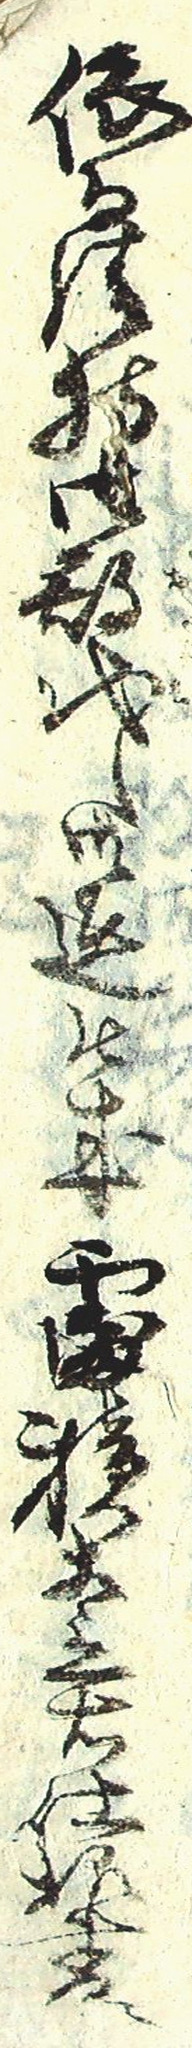依て請持御郡代へ御達被成処積相立右仕様書に

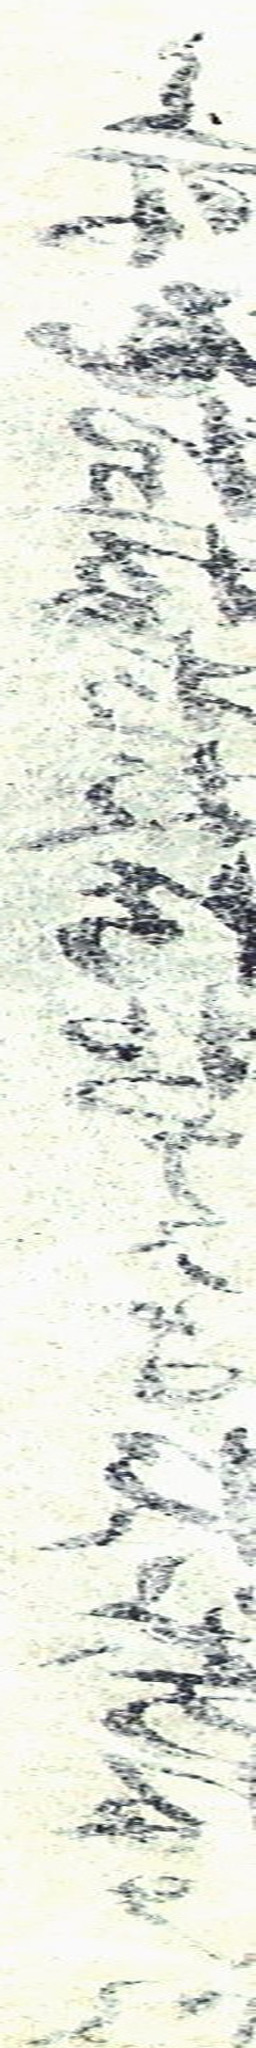九月十一日
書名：諸御願書控(弐番）
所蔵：鳴門教育大学 Naruto University of Education
